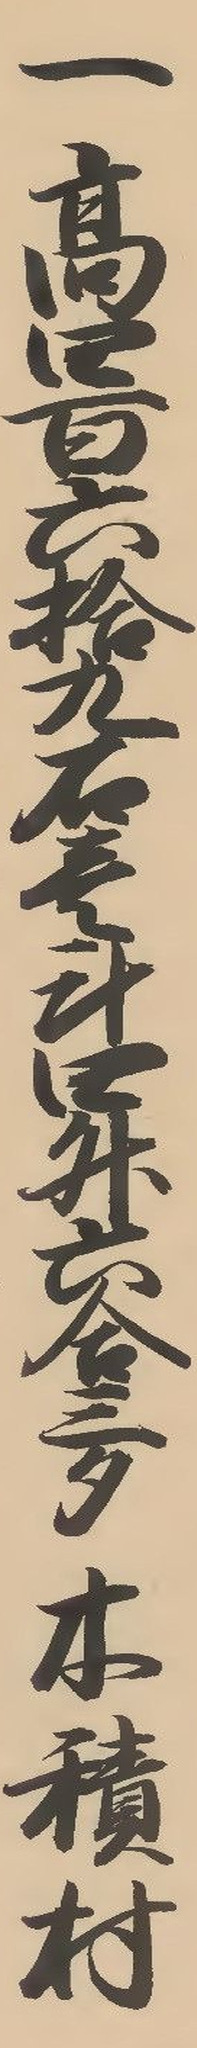一高四百六拾九石壱斗四升六合三勺木積村
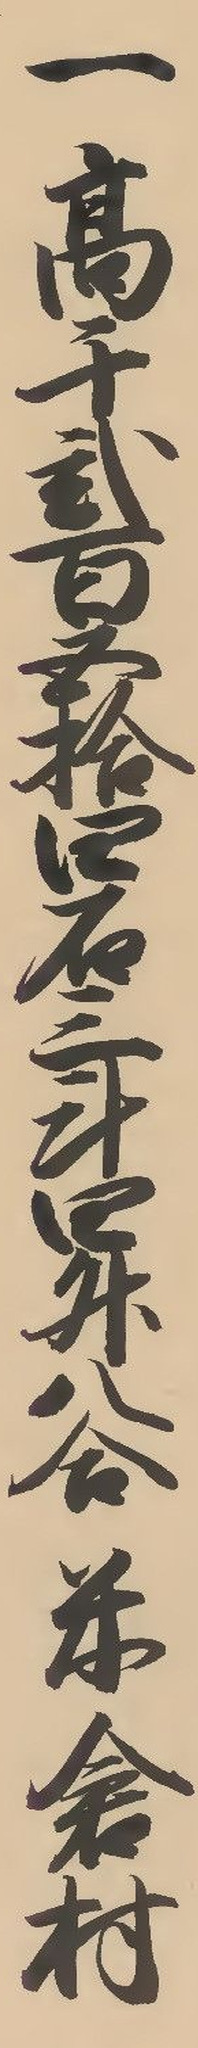一高千弐百五拾四石三斗四升八合米倉村

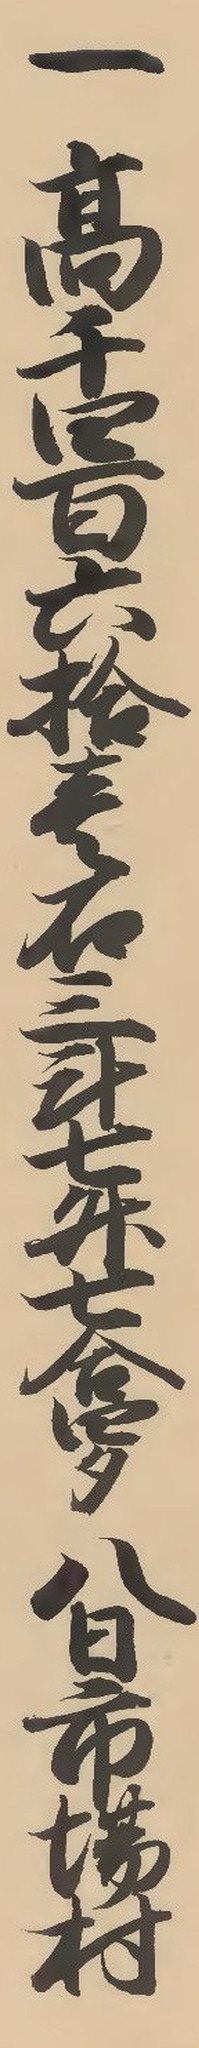一高千四百六拾壱石三斗七升七合四勺八日市場村
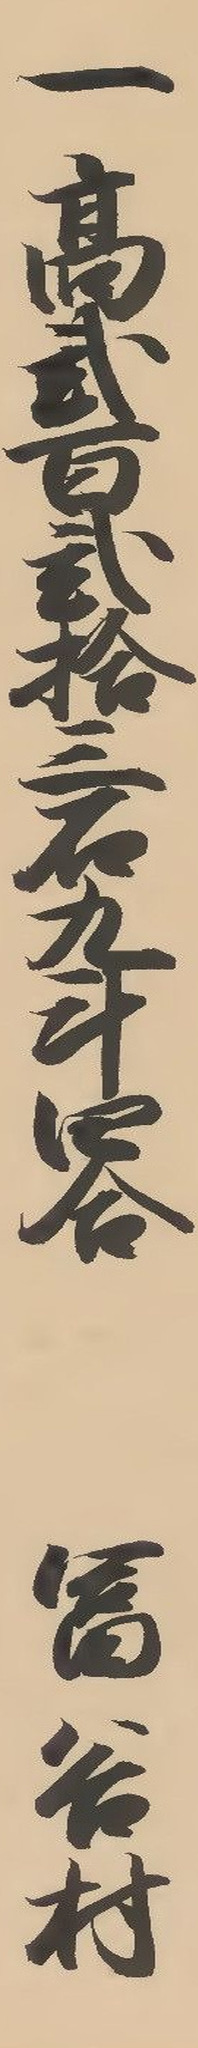一高弐百弐拾三石九斗四合富谷村
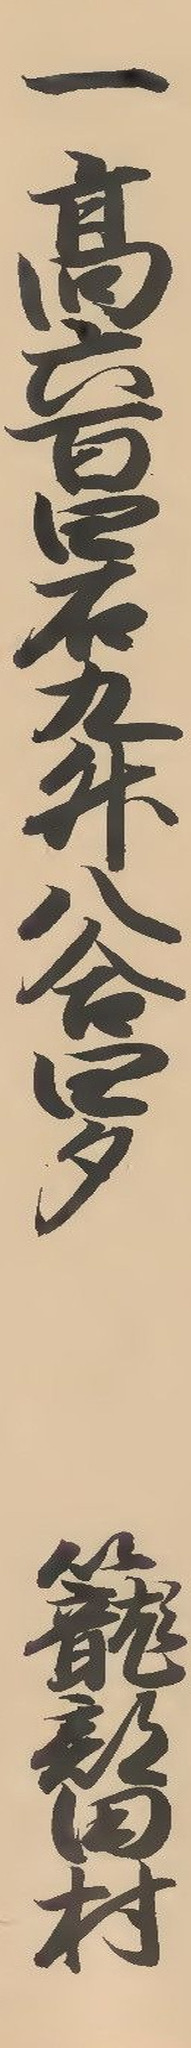一高六百四石九升八合四勺籠部田村
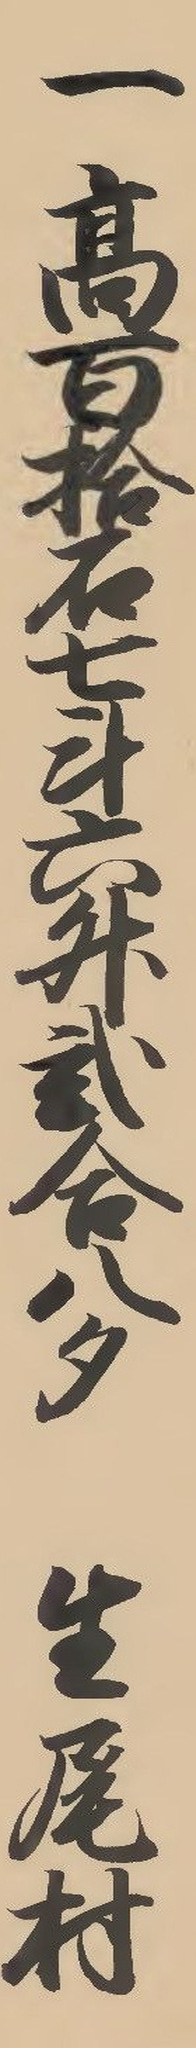一高百拾石七斗六升弐合八勺生尾村
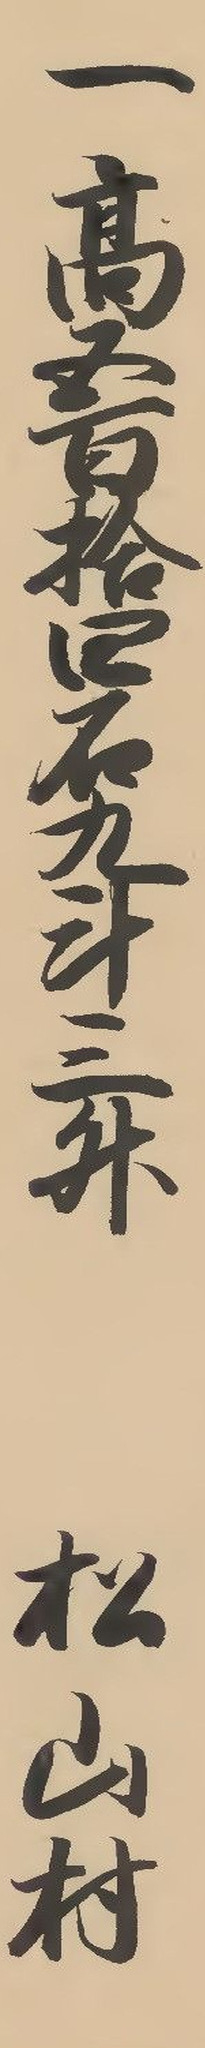一高五百拾四石九斗三升松山村

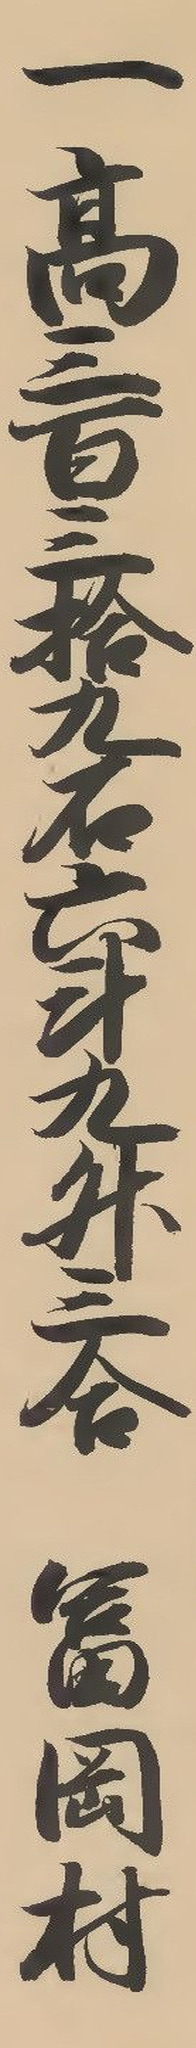一高三百五拾九石弐斗五升四合長岡村
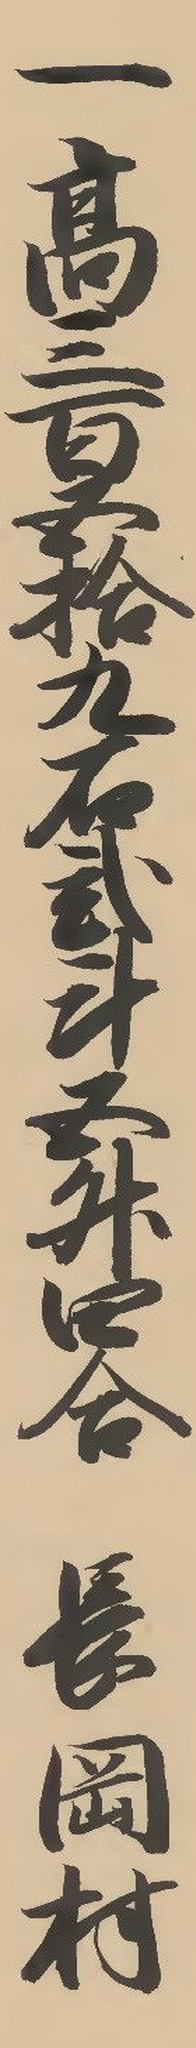一高三百五拾九石弐斗五升四合長岡村
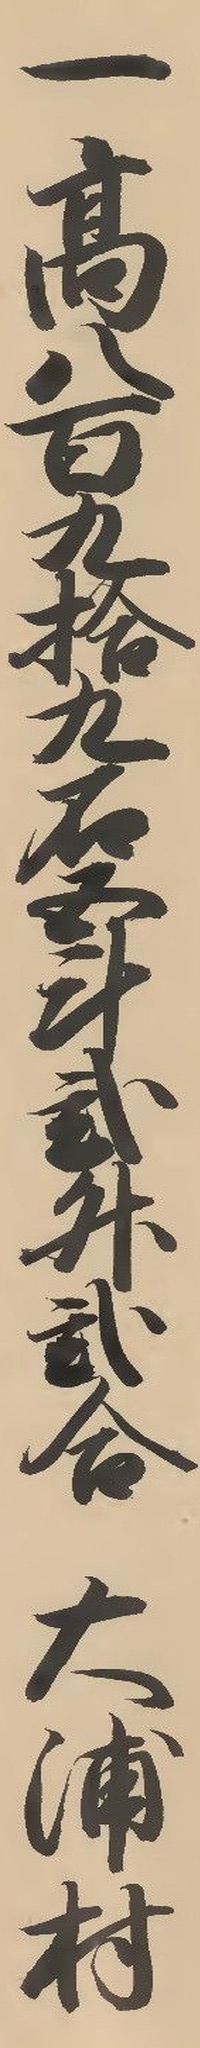一高八百九拾九石五斗弐升弐合大浦村
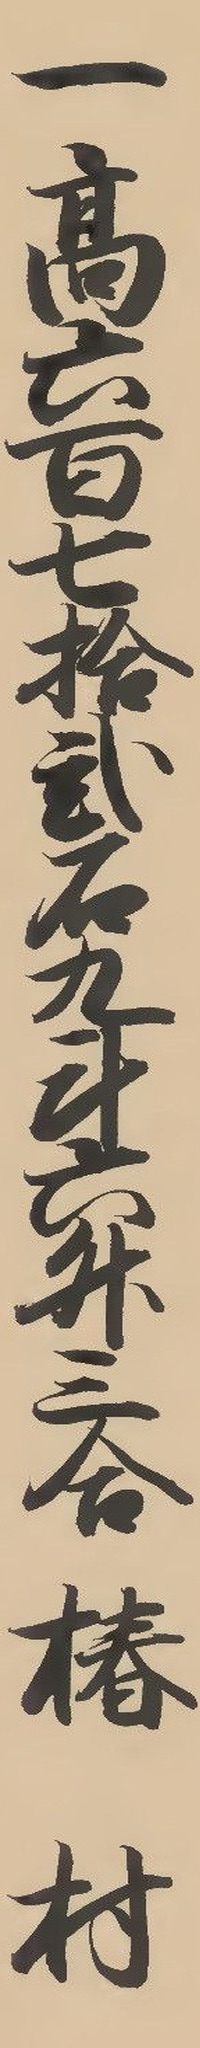一高六百七拾弐石九斗六升三合椿村
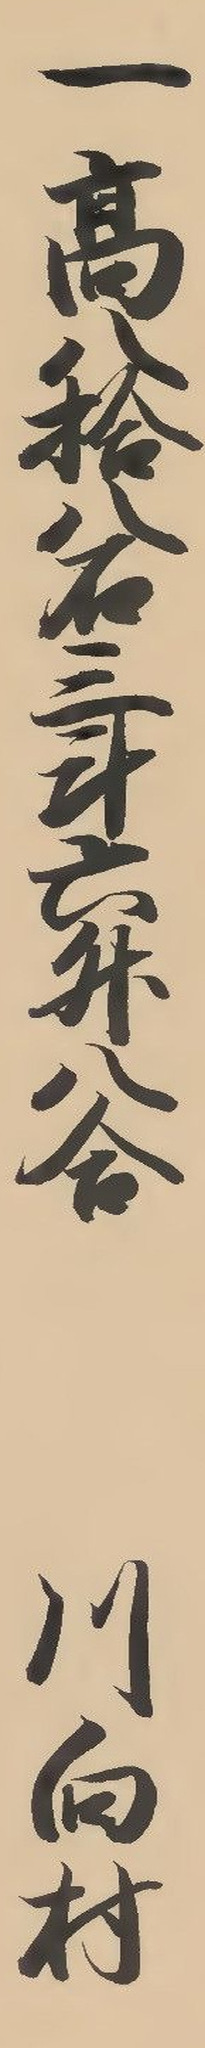一高八拾八石三斗六升八合川向村
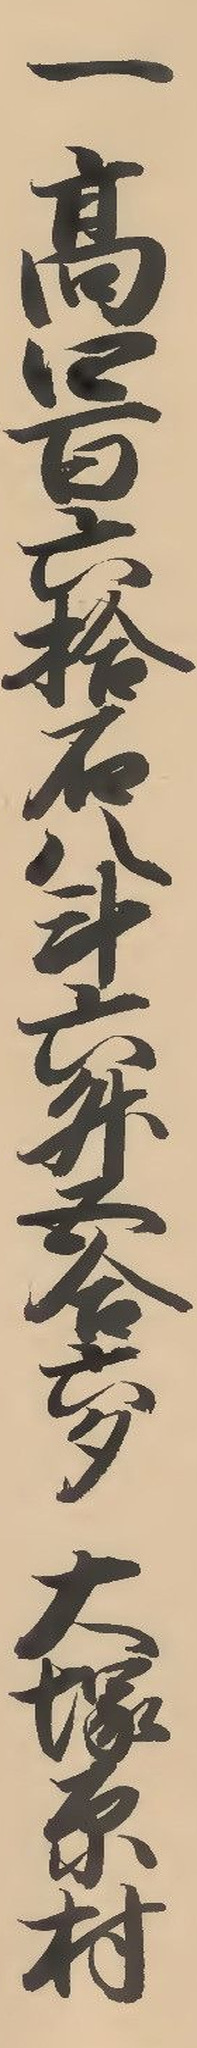一高四百六拾石八斗六升五合六勺大塚原村
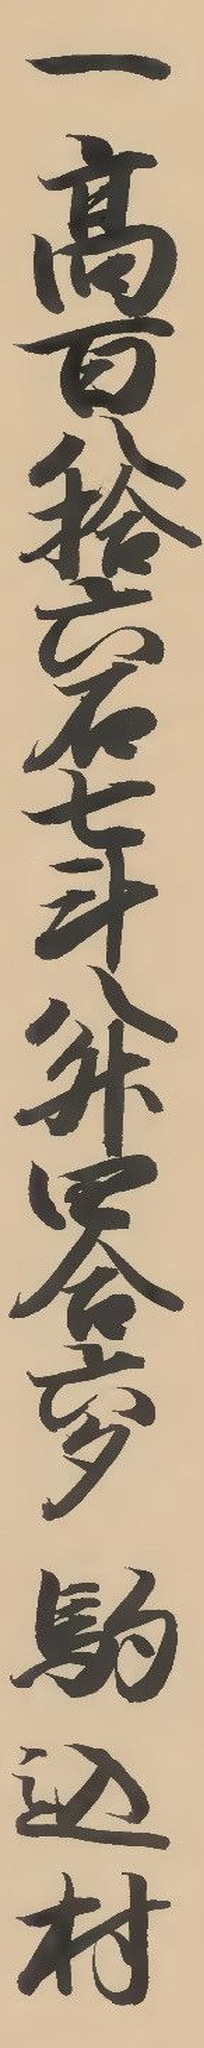一高百八拾六石七斗八升四合六勺駒込村
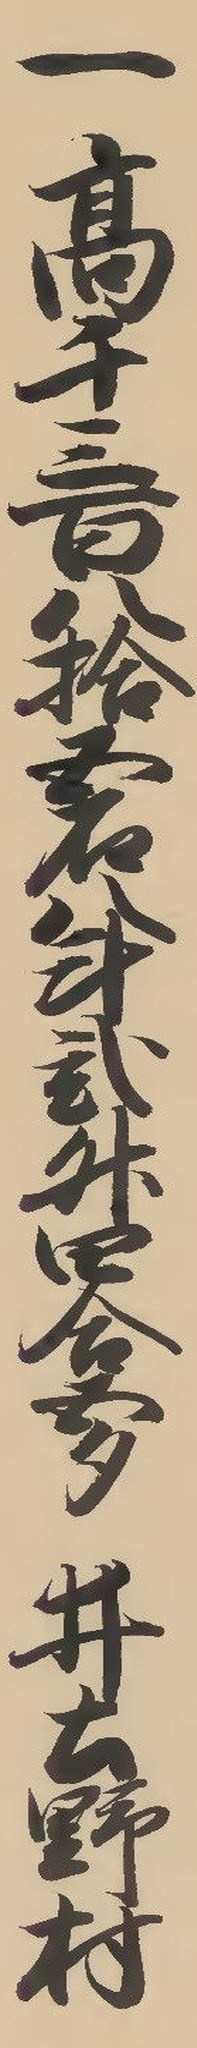一高千三百八拾五石八斗弐升四合五勺井土野村

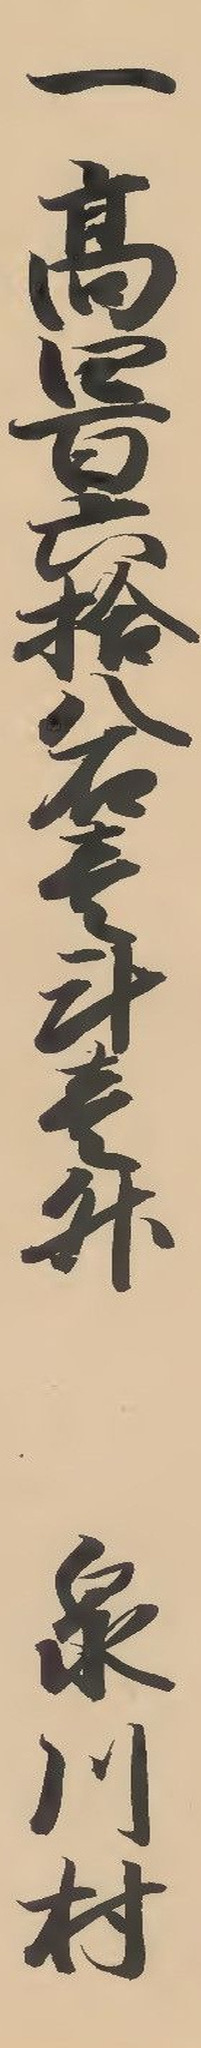一高四百六拾八石壱斗壱升泉川村
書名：下総国郷帳
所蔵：国立公文書館 National Archives of Japan
